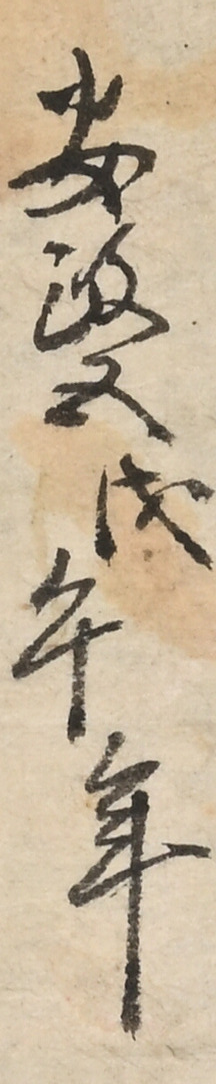安政五戊午年
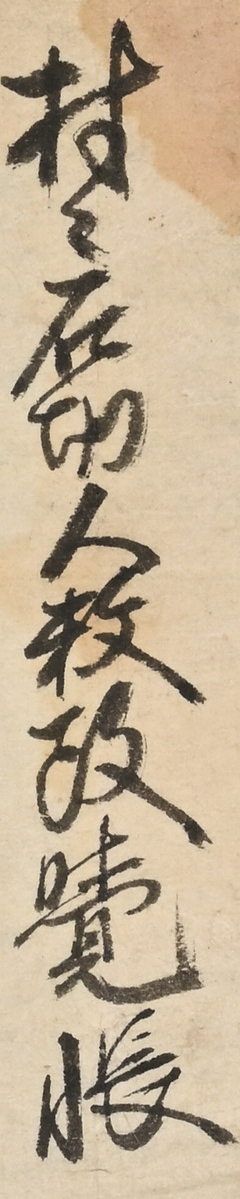村々石切人数改覚帳

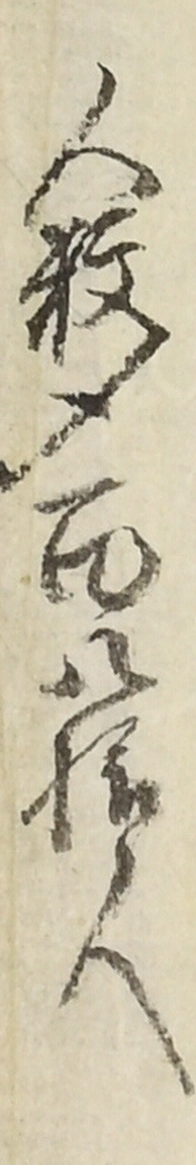人数〆百八拾人

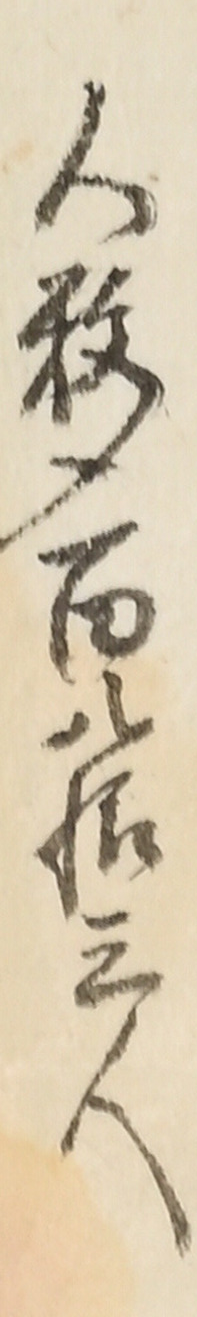人数〆百八拾三人
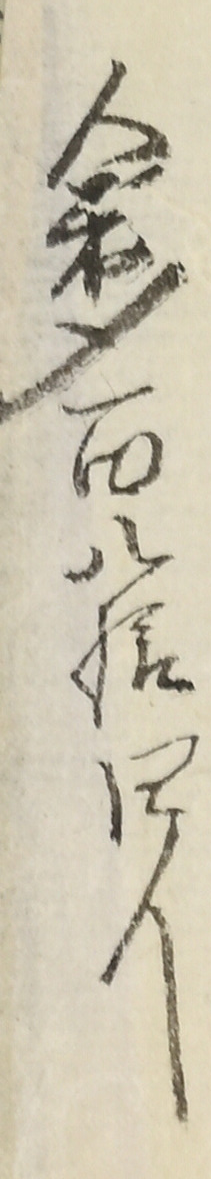人数〆百八拾四人

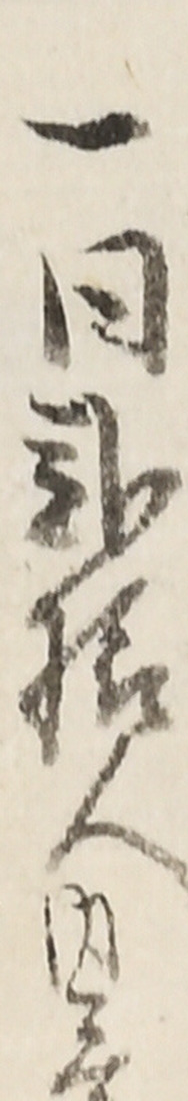一同弐拾人荊口村
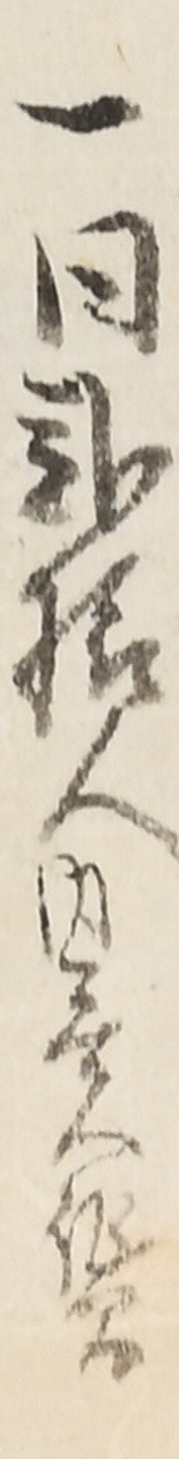一同弐拾人荊口村

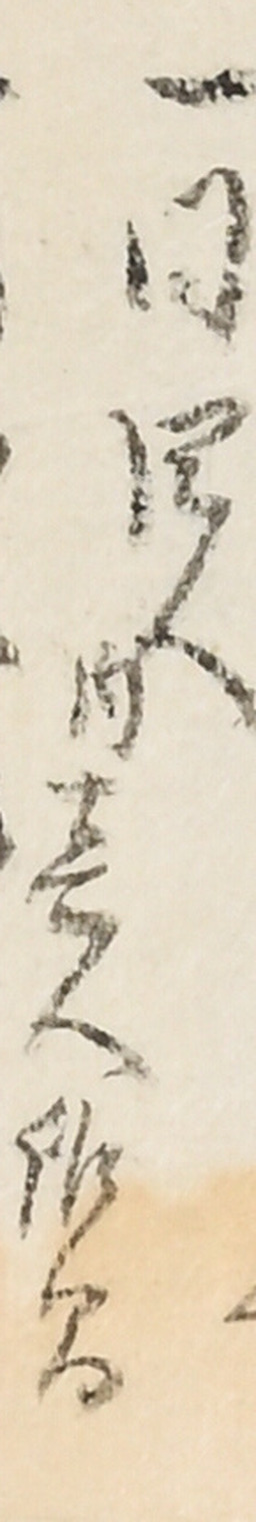内拾人作間
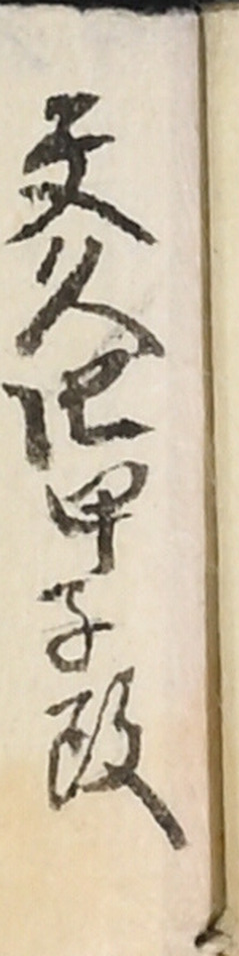文久四甲子改
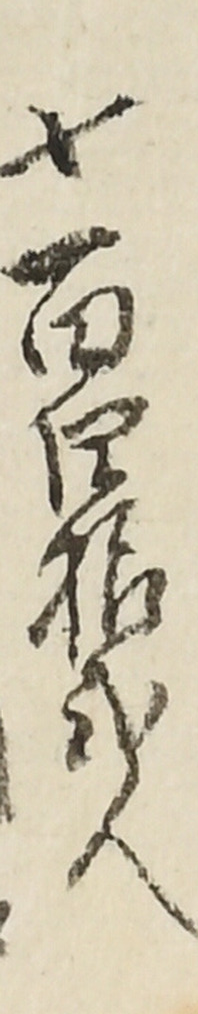〆百四拾弐人
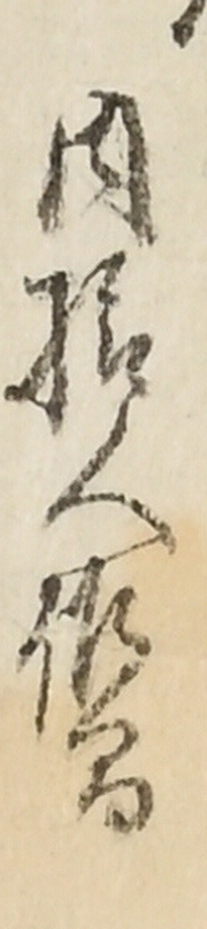内拾人作間

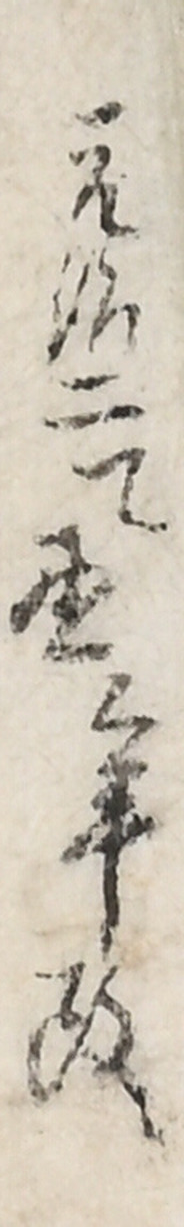元治二乙丑年改
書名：安政五戊午年八月村々石切人数改覺帳
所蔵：伊那市立高遠町図書館・合同会社AMANE
